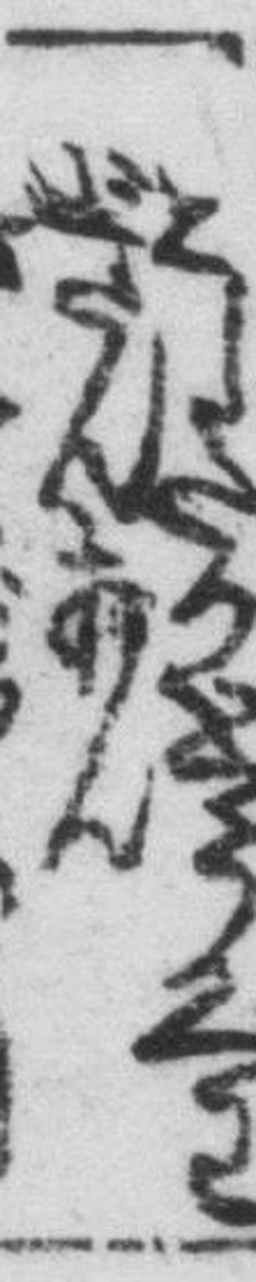ぎんあん
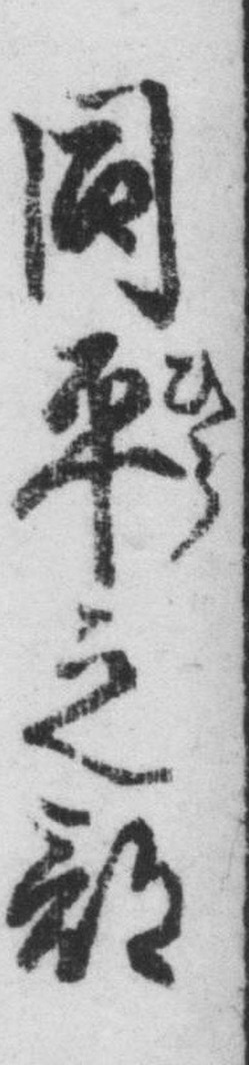同平之部
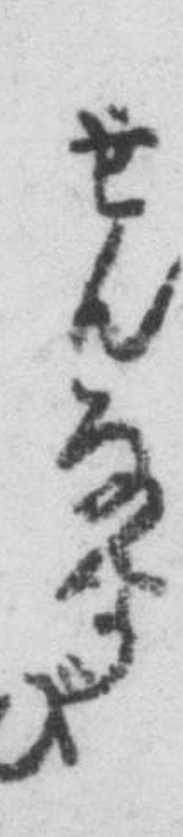せんなすび
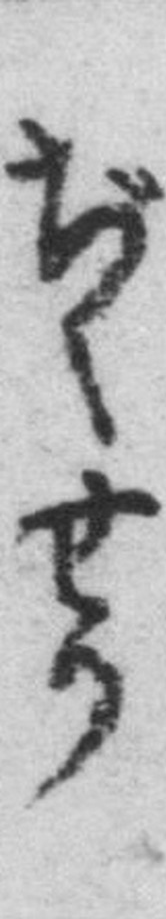ぢくせり
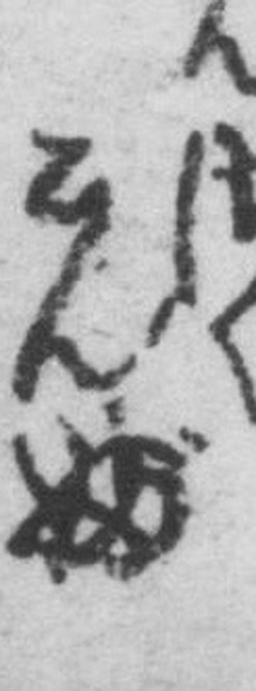こんぶ

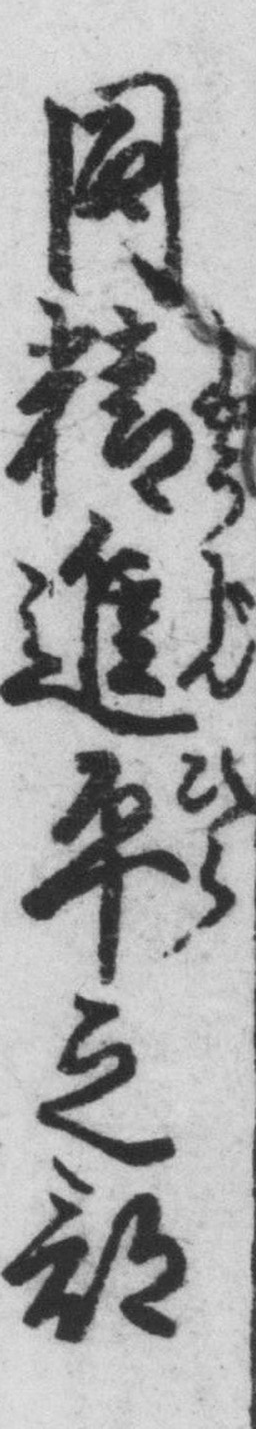同精進平之部
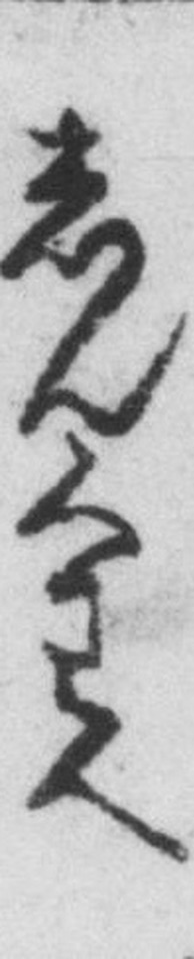せんくわい
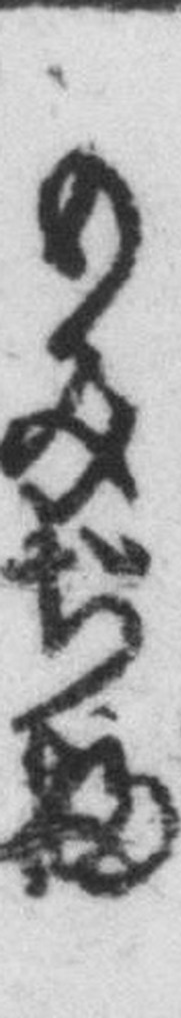もみぢふ
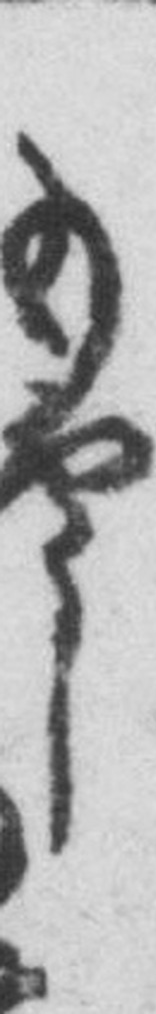もやし
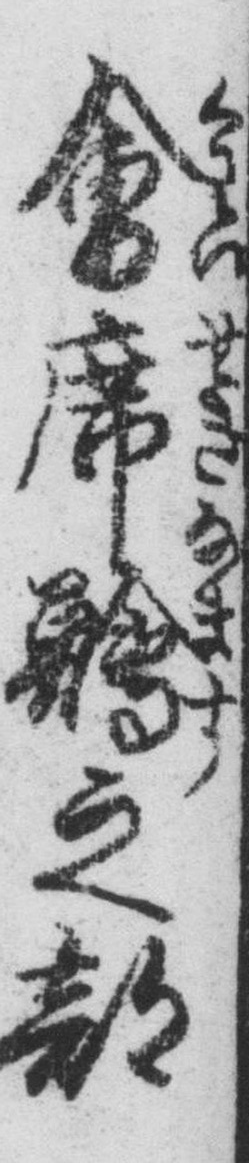會席鱠之部
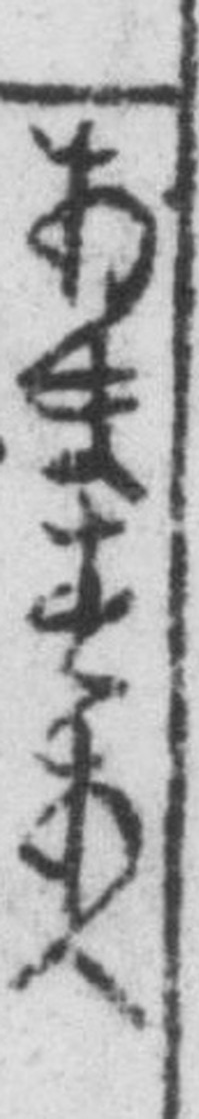あますあへ
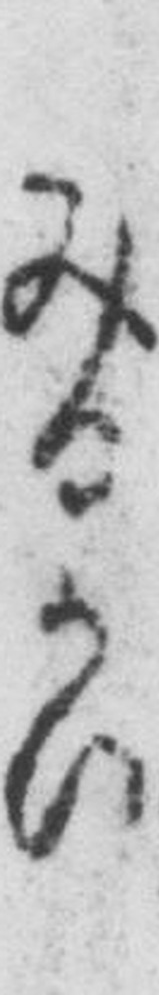みるかい
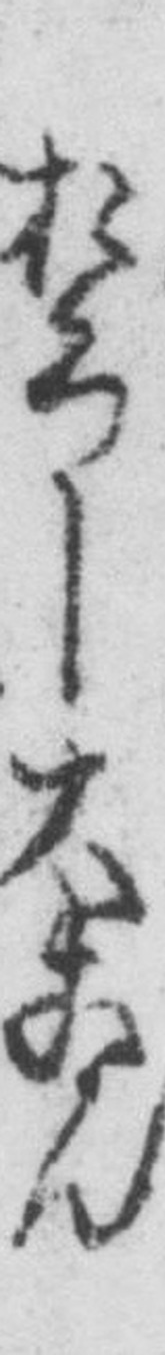おろし大こん
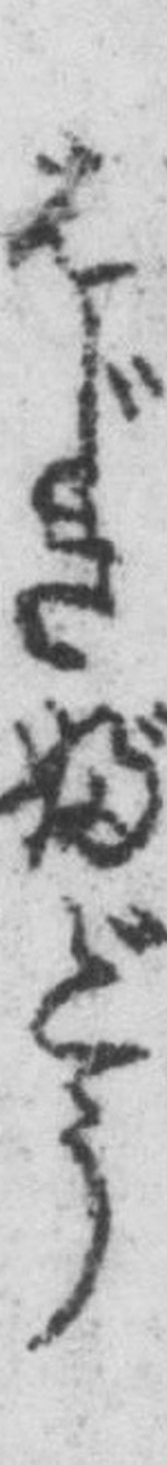はじきぶどう
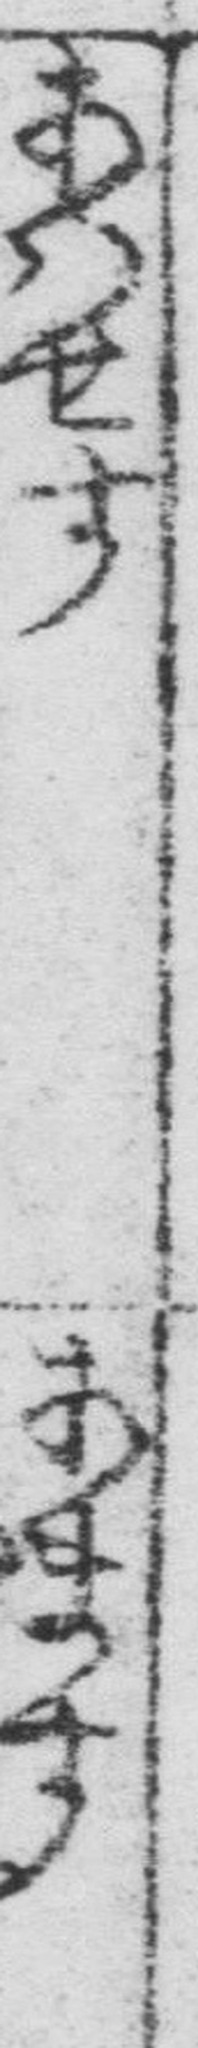あハせすあます
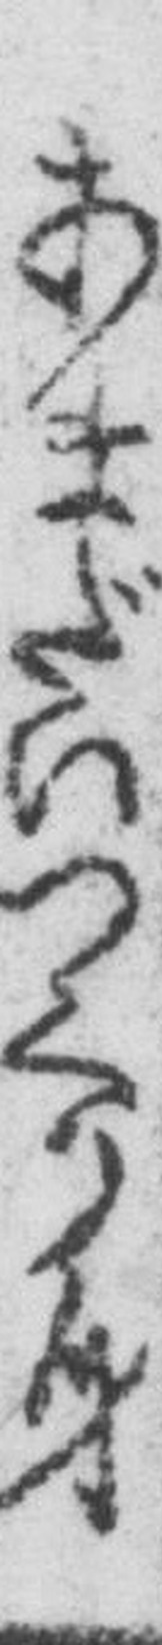あまだいつくり身
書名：即席庖丁
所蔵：大阪府立大学学術情報センター 国文学研究資料館
